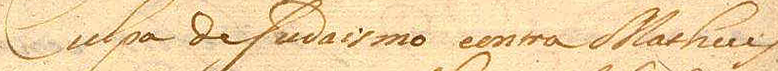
Culpa de Judaismo contra Matheus
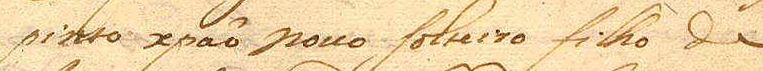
pinto xpaõ nouo solteiro filho de
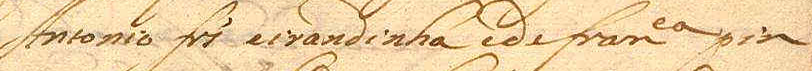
Antonio frs̄ cirandinha e de franca pin
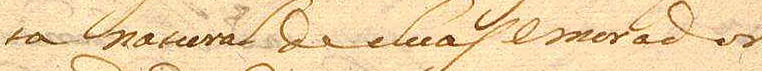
ta natural de eluas e morador
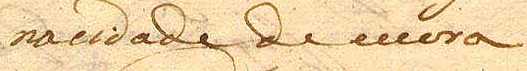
na cidade de euora.
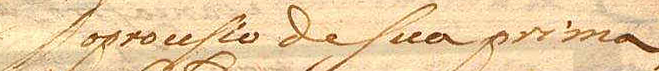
Do processo de sua prima,
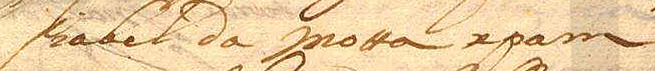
jzabel da motta xpam
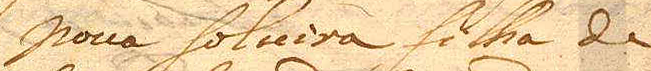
noua solteira filha de
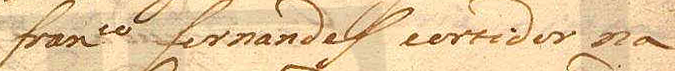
franco fernandes cortidor na
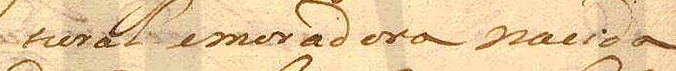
tural e moradora na cida
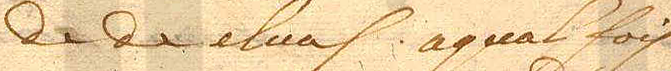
de de eluas. a qual foy
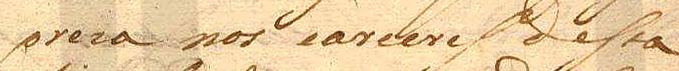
preza nos carceres desta
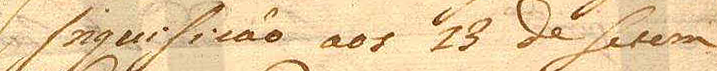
Jnquisicaõ aos 13 de setem
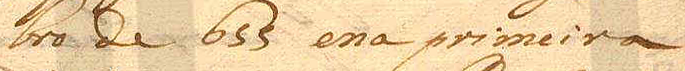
bro de 655 e na primeira
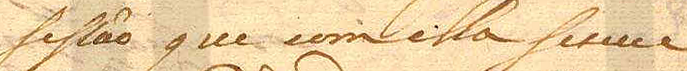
sessaõ que com ella se teue
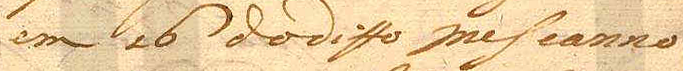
em 16 do ditto mes e anno
